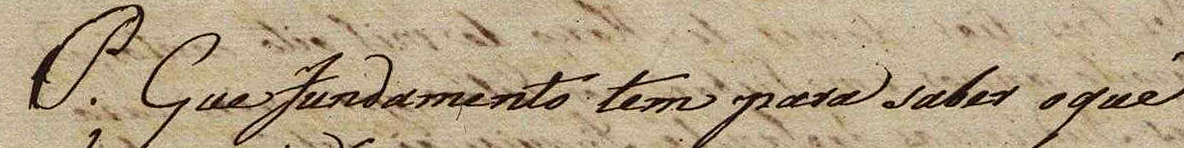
P. Que fundamento tem para saber o que
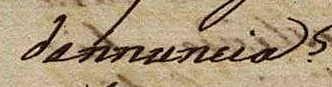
dennuncia?
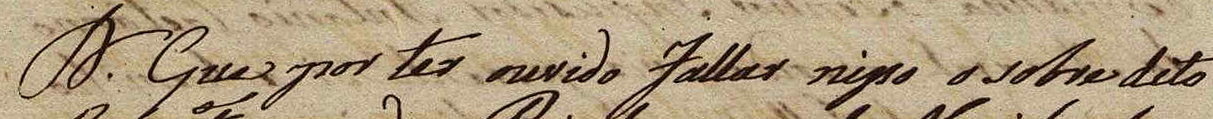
D. Que por ter ouvido fallar nisso o sobredito
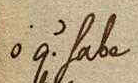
o q̄ sabe
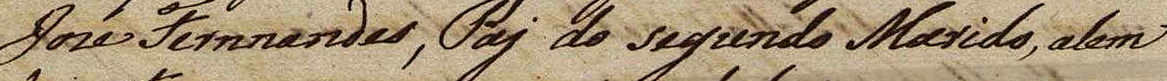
Jozé Fernnandes, Paj do segundo Marido, alem
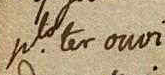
p.lo ter ouvi
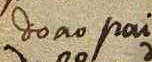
do ao pai
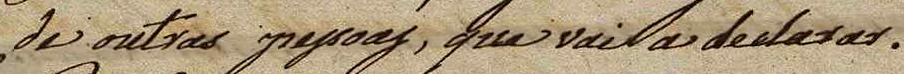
de outras pessoas, que vai a declarar.
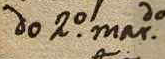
do 2.o mar.do
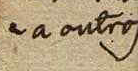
e a outros
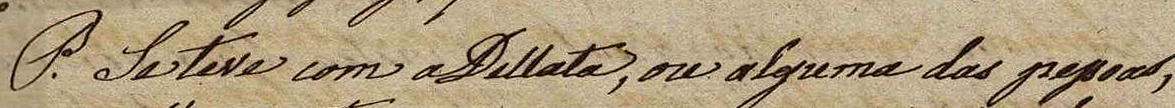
P. Se teve com a Dellata, ou alguma das pessoas,
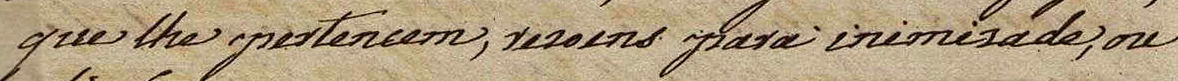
que lhe pertencem, rezoens para inimizade, ou
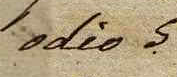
odio?
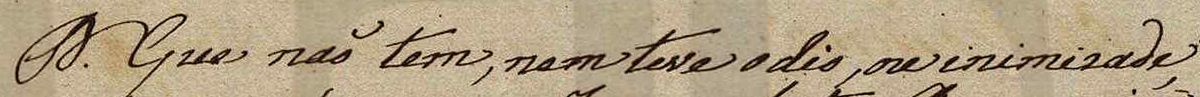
D. Que naõ tem, nem teve odio, ou inimizade,
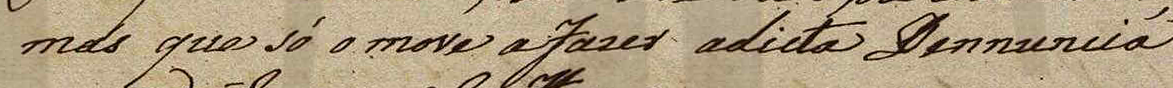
mas que só o move a fazer a dicta Dennuncia
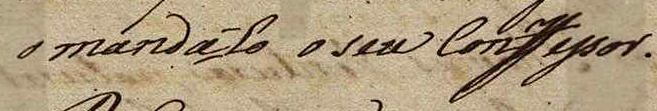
o manda-lo o seu Conffessor.
